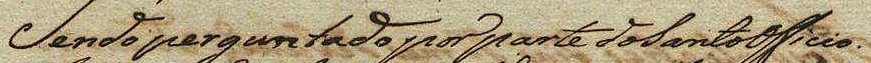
Sendo perguntado por parte do Santo Officio.
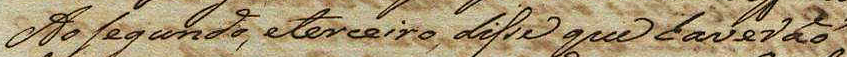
Ao segundo, e terceiro, disse que haveraõ
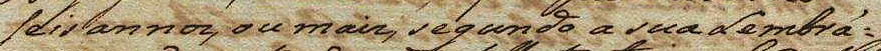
seis annos, ou maiz, segundo a sua Lembrā
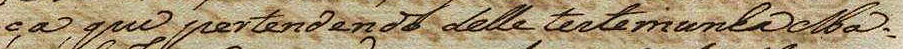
ça, que pertendendo delle testemunha Ma
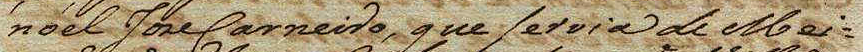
noel Joze Carneiro, que servia de Mei
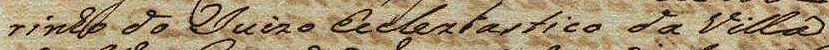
rinho do Iuizo Eccleziastico da Villa
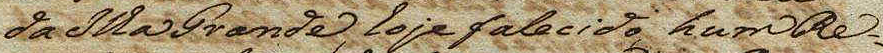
da Ilha Grande, hoje falecido, hum Re
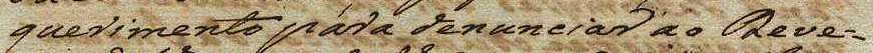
querimento para denunciar ao Reve
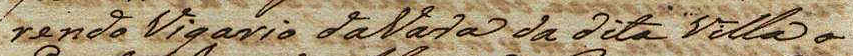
rendo Vigario da Vara da dita Villa o
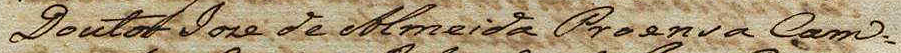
Doutor Ioze de Almeida Proensa Cam
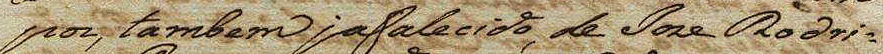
poz, tambem ja falecido, de Ioze Rodri
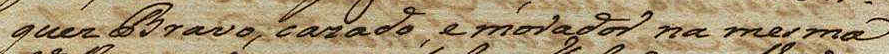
guez Bravo, cazado, e morador na mesma
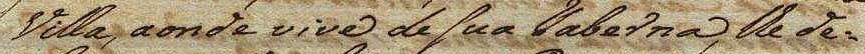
Villa, aonde vive de sua Taberna, lhe de
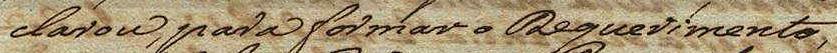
clarou, para formar o Requerimento,
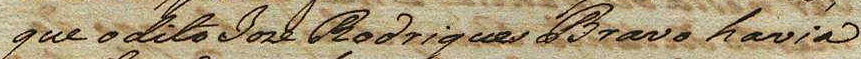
que o dito Ioze Rodrigues Bravo havia
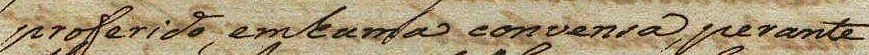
proferido, em huma convensa, perante
